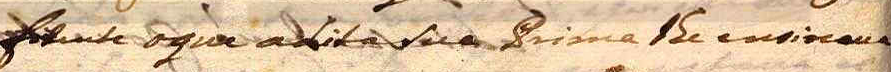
fitente o que a dita sua Prima lhe ensinaua
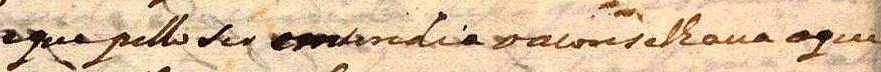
e que pello ser emtendia o aconselhaua o que
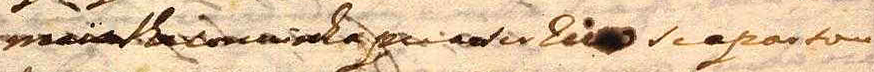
mais lhe conuinha pera ser rico se apartou
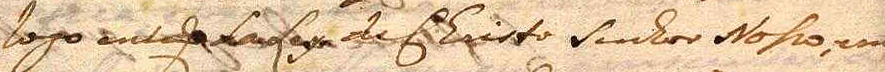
logo entaõ da Ley de Christo Senhor Nosso, em
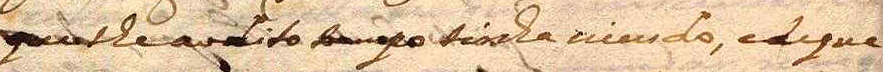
que the ao dito tempo tinha uiuido, e de que
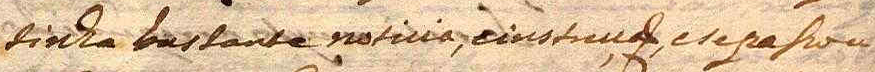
tinha bastante noticia, e instruçaõ, e se passou
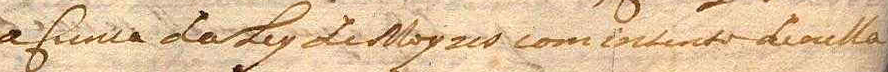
a Crenca da Ley de Moyzes com intento de nella
